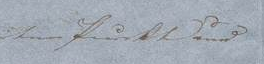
zweiten Punkt und
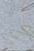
mit
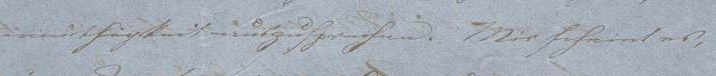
aller Freimüthigkeit auszusprechen. Mir scheint es,
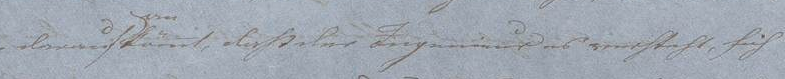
Dingen darauf ankömmt, daß der Ingenieur es versteht, sich
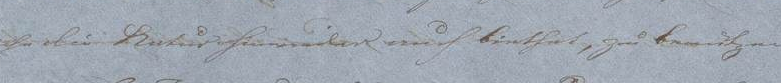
welche die Natur hinwieder auch biethet, zu benützen
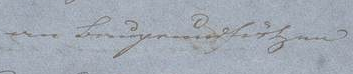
an Baugrundsätzen
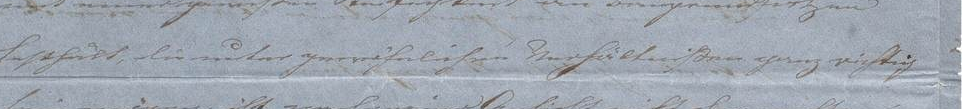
festhält, die unter gewöhnlichen Verhältnißen ganz richtig
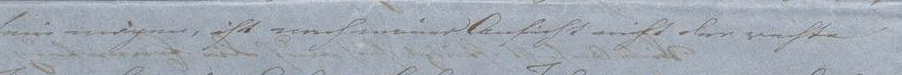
sein mögen, ist nach meiner Ansicht nicht der rechte
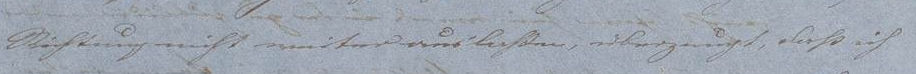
Richtung nicht weiter auslaßen, überzeugt, daß ich
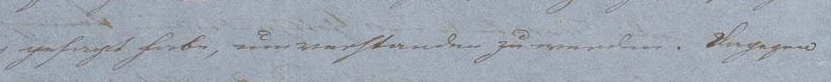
genug gesagt habe, um verstanden zu werden. Dagegen
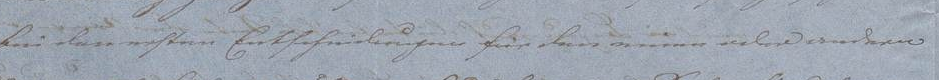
bei den ersten Entscheidungen für den einen oder andern
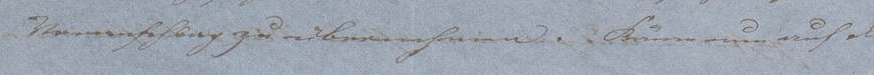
Voranschlag zu übernehmen. Käme nun auf der
